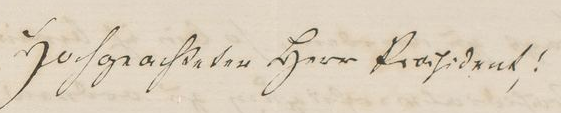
Hochgeachteter Herr Präsident!
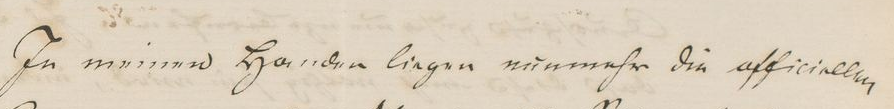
In meinen Handen liegen nunmehr die officiellen
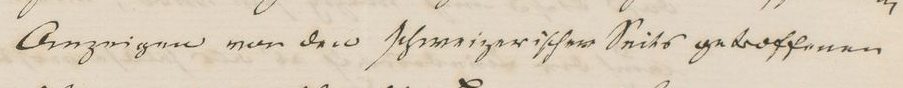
Anzeigen von den schweizerischer Seits getroffenen
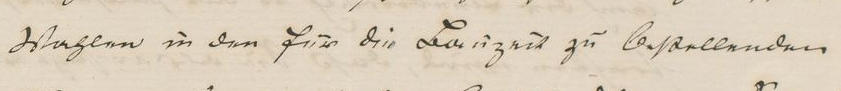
Wahlen in den für die Bauzeit zu bestellenden
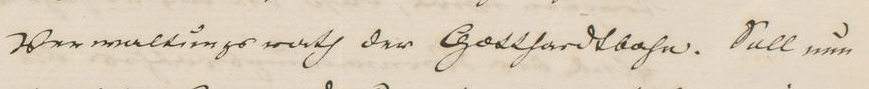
Verwaltungsrath der Gotthardtbahn. Soll nun
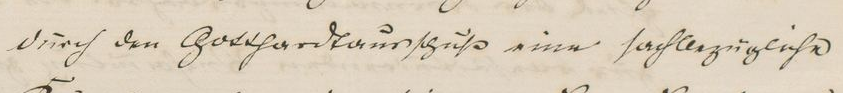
durch den Gotthardtausschuß eine sachbezügliche
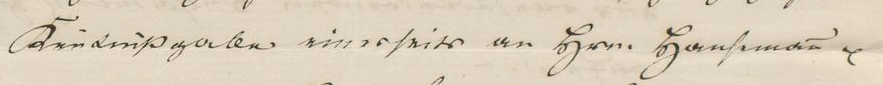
Kenntnißgabe einerseits an Hrn. Hansemann &
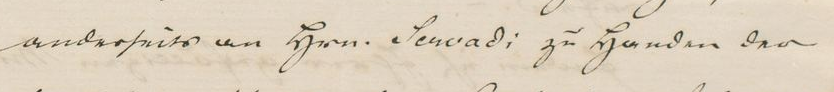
anderseits an Hrn. Senvadi zu Handen des
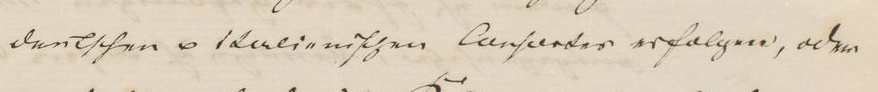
deutschen & italienischen Consortes erfolgen, oder
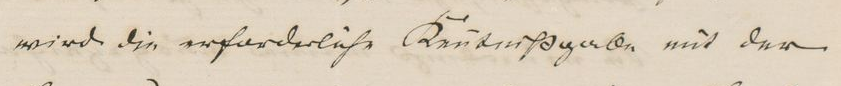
wird die erforderliche Kenntnißgabe mit der
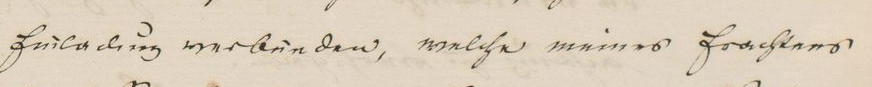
Einladung verbunden, welche meines Erachtens
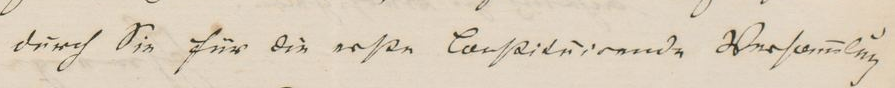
durch Sie für die erste Constituirende Versammlung
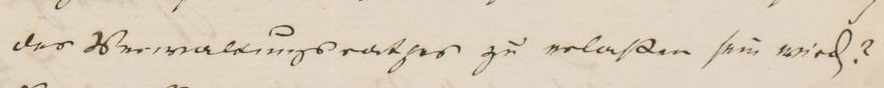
des Verwaltungsrathes zu erlaßen sein wird?
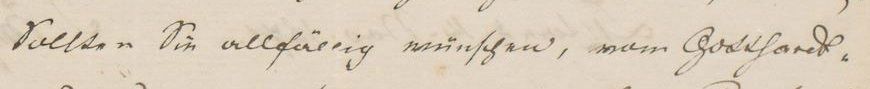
Sollten Sie allfällig wünschen, vom Gotthardt -
